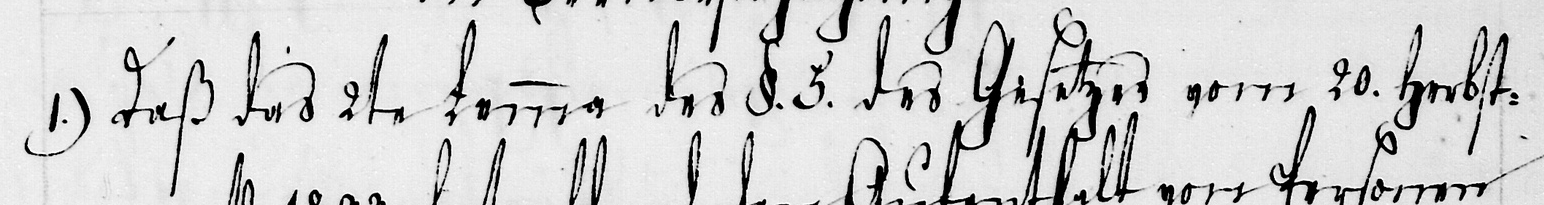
1.) Daß das 2te Lemma des §. 5. des Gesetzes vom 20. Herbst¬
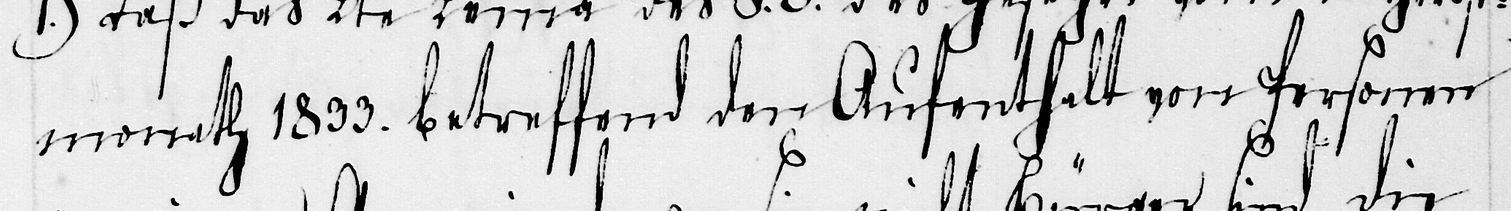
monath 1833. betreffend den Aufenthalt von Personen
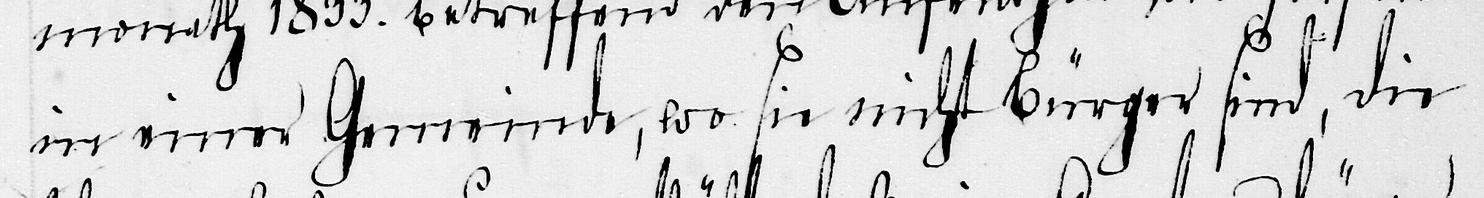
in einer Gemeinde, wo sie nicht Bürger sind, die
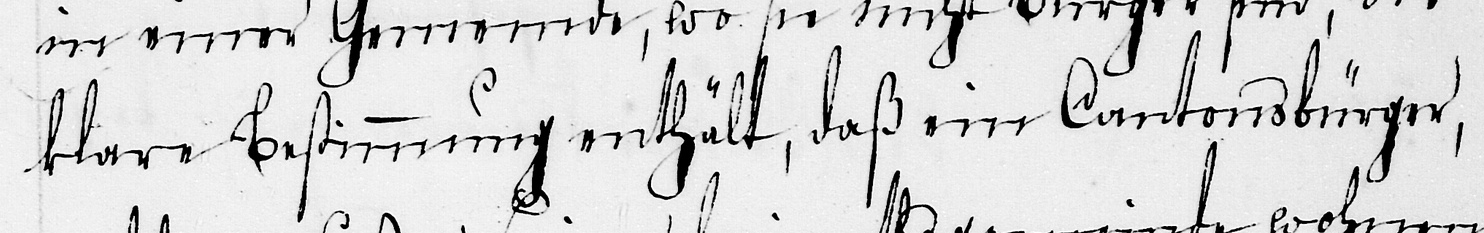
klare Bestimmung enthält, daß ein Cantonsbürger,
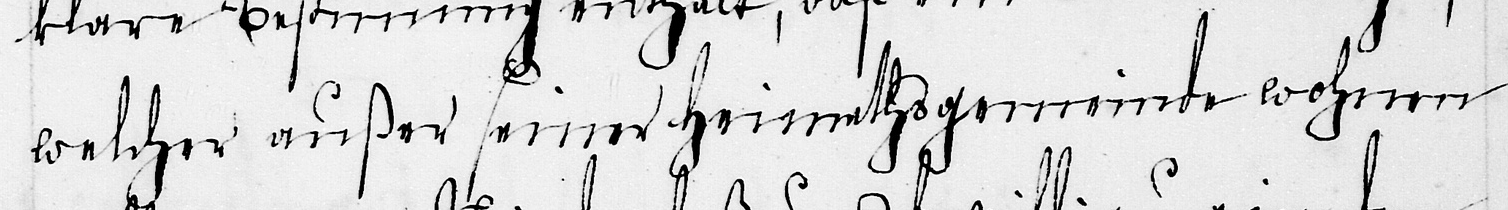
welcher außer seiner Heimathsgemeinde wohnen
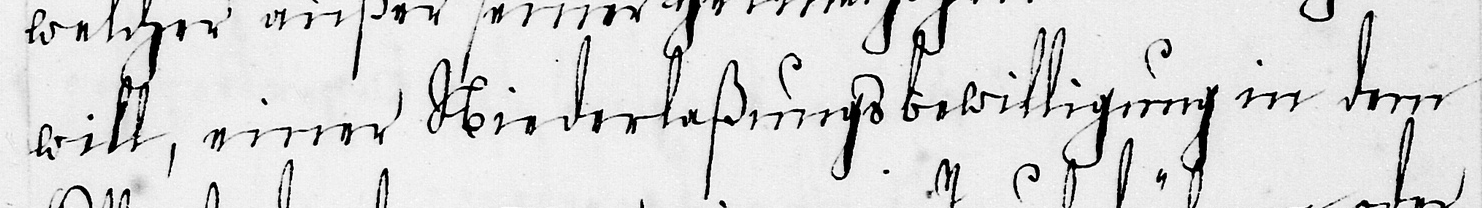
will, einer Niederlaßungsbewilligung in dem
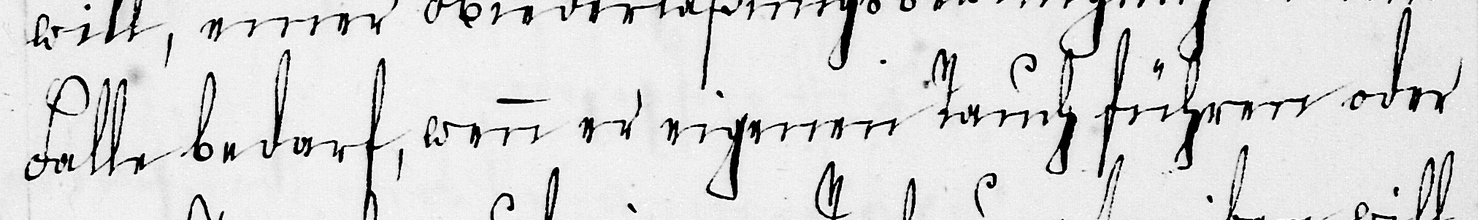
Falle bedarf, wenn er eigenen Rauch führen oder
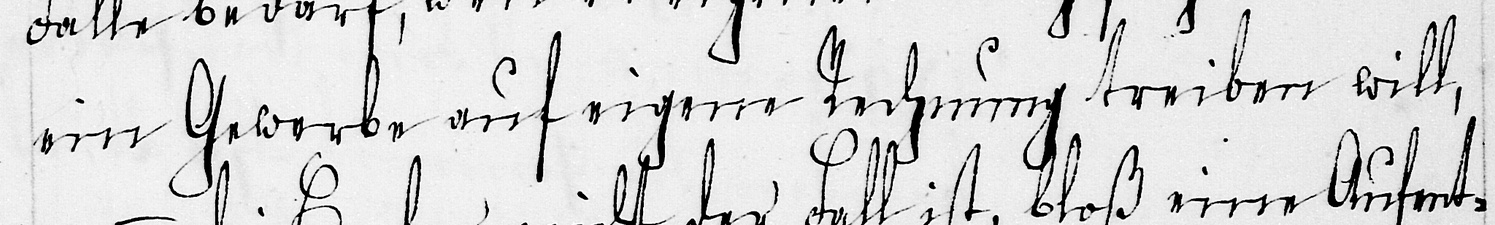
ein Gewerbe auf eigene Rechnung treiben will,
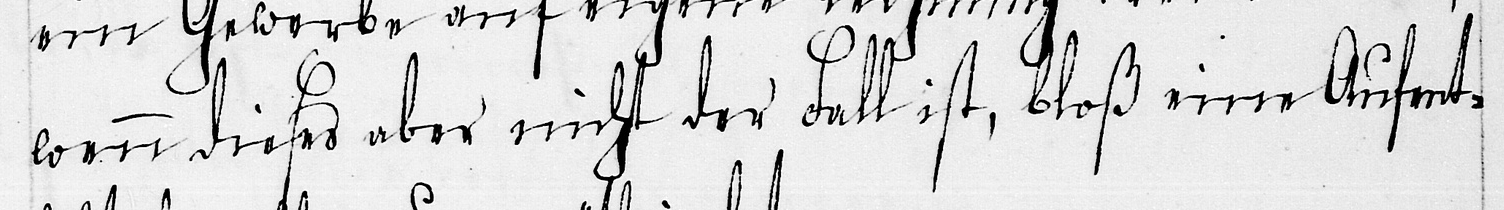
wenn dieses aber nicht der Fall ist, bloß eine Aufent¬
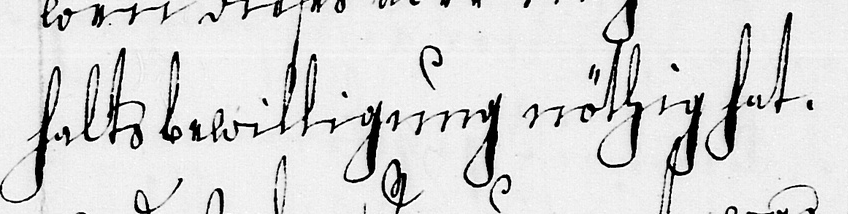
ltsbwewilligung nöthig hat.
